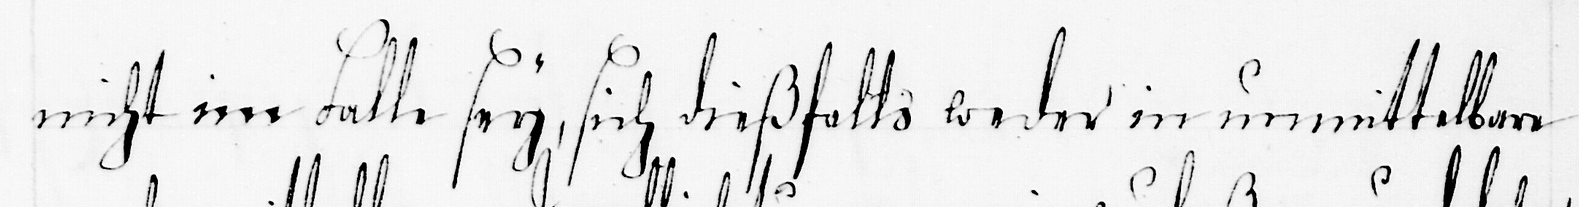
nicht im Falle sey, sich dießfalls weder in unmittelbare
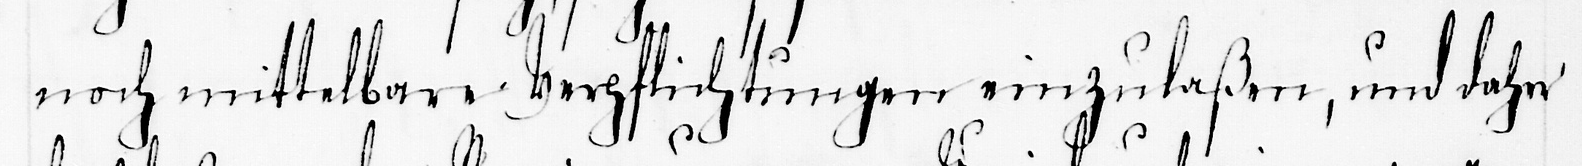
noch mittelbare Verpflichtungen einzulaßen, und daher
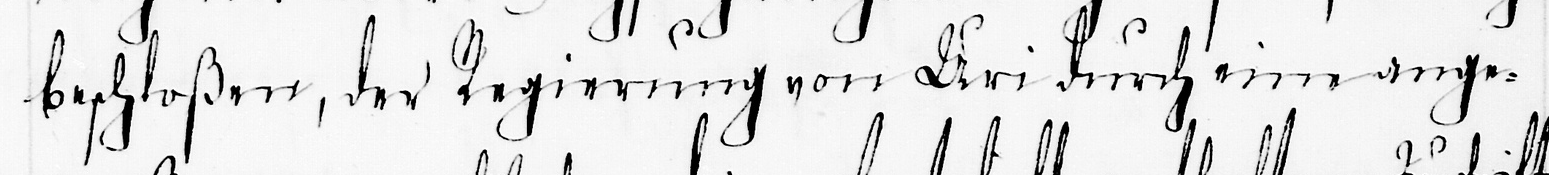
beschloßen, der Regierung von Uri durch eine ange¬
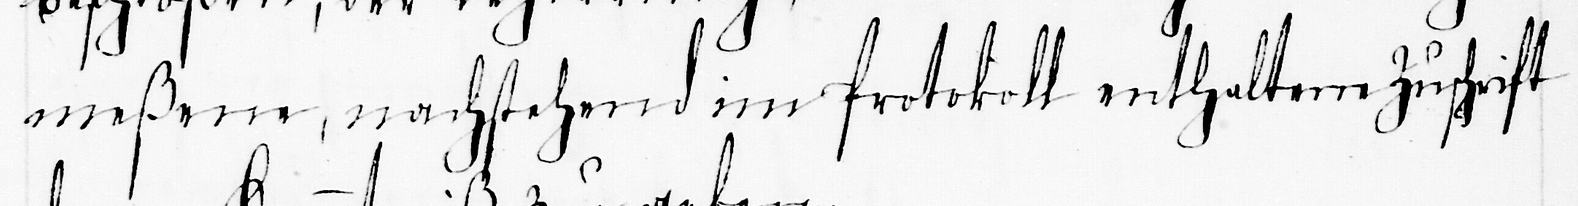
meßene, nachstehend im Protokoll enthaltene Zuschrift
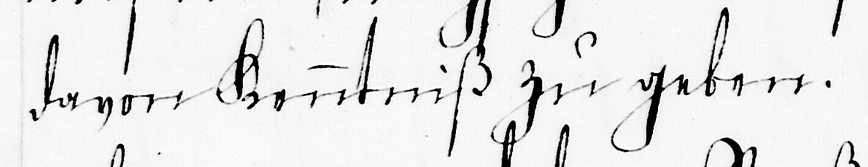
davon Kenntniß zu geben.
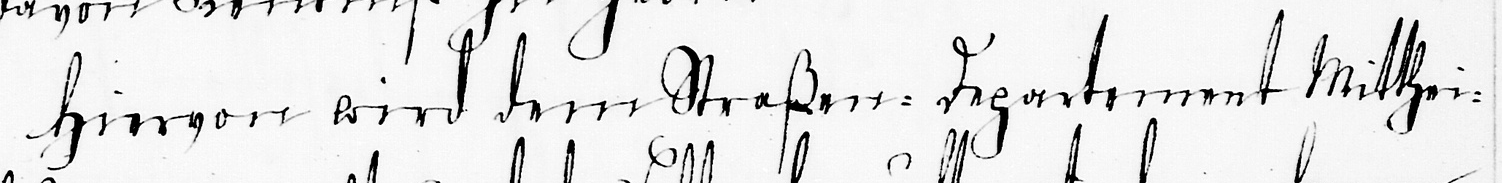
Hiervon wird dem Straßen-Departement Mitthei¬
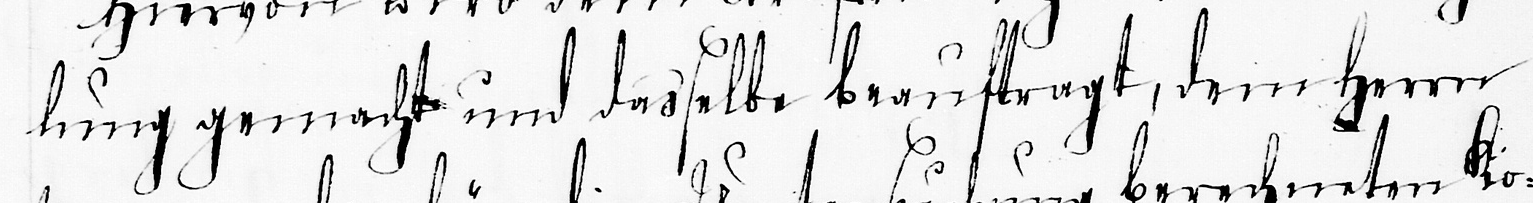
lung gemacht und dasselbe beauftragt, dem Herrn
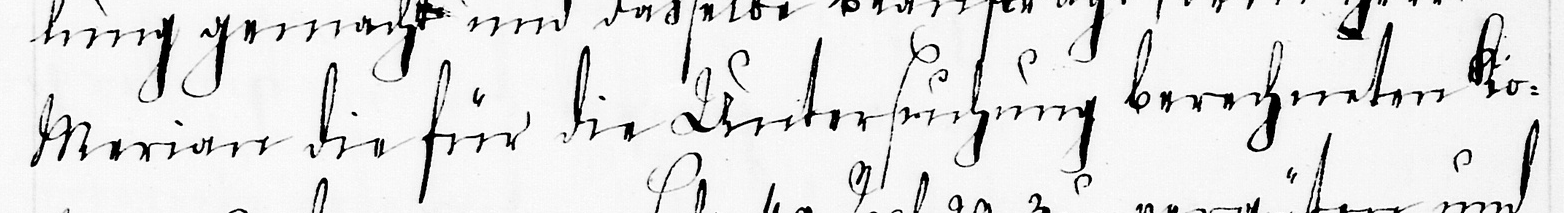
Merian die für die Untersuchung berechneten Ko¬
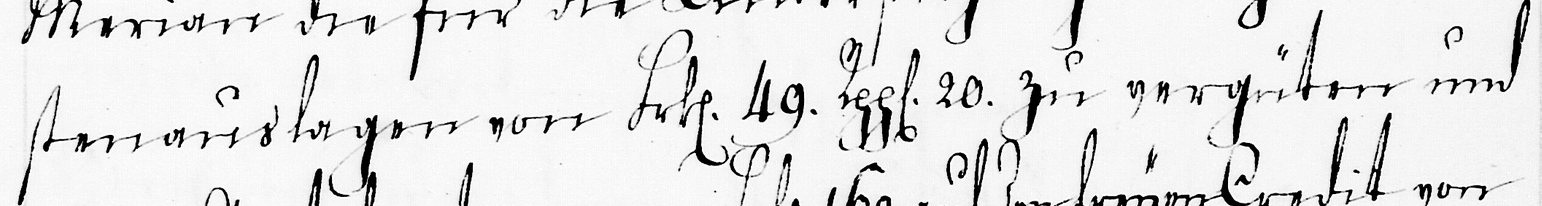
stenauslagen von Frk[en]. 49. Rpp[en]. 20. zu vergüten und
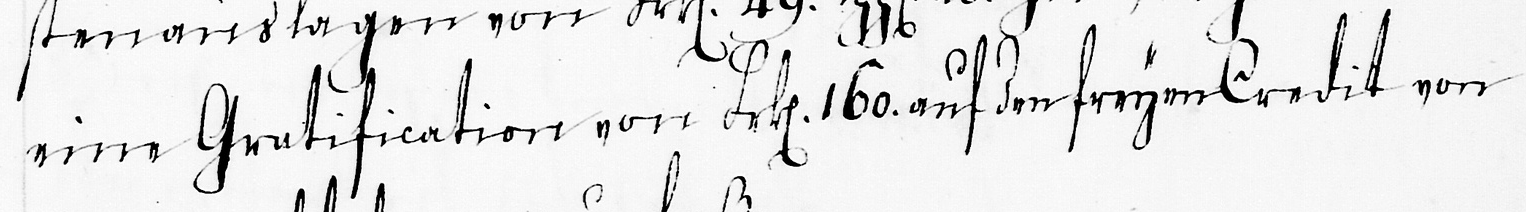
eine Gratification von Frk[en]. 160. auf den freyen Credit von
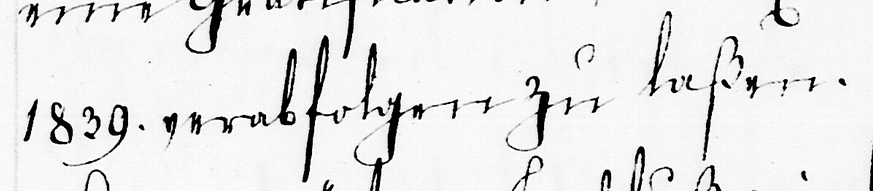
1839. verabfolgen zu laßen.
